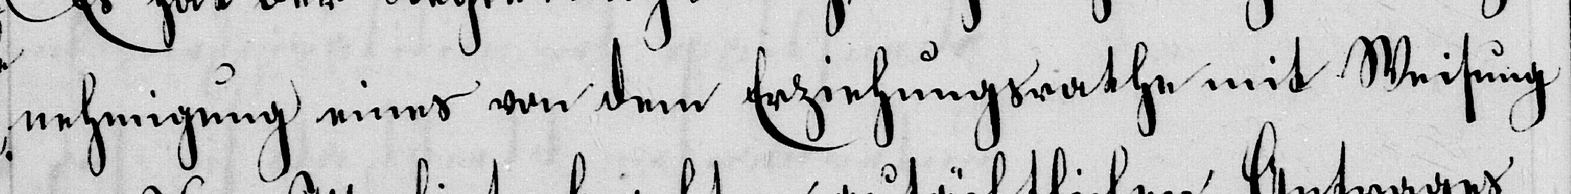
nehmigung eines von dem Erziehungsrathe mit Weisung
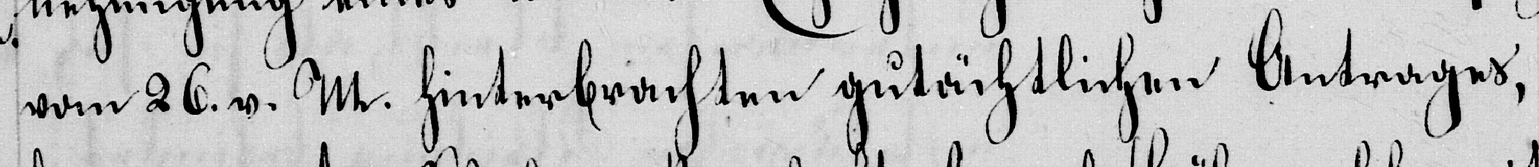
vom 26. v. M. hinterbrachten gutächtlichen Antrages,
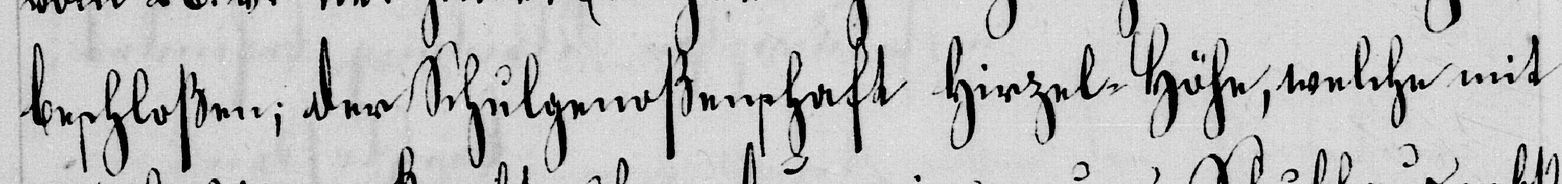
beschloßen; der Schulgenoßenschaft Hirzel-Höhe, welche mit
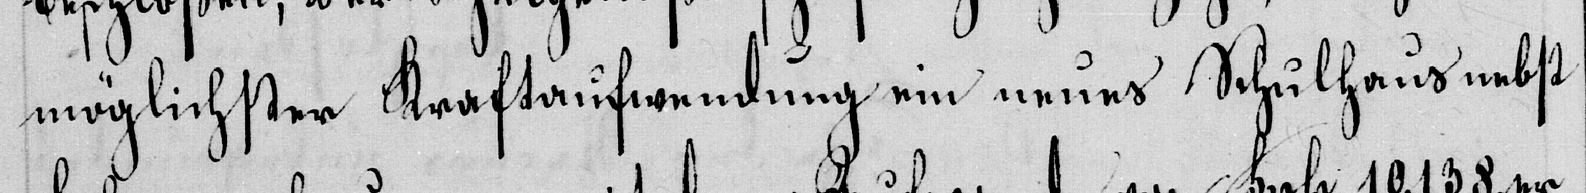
möglichster Kraftaufwendung ein neues Schulhaus nebst
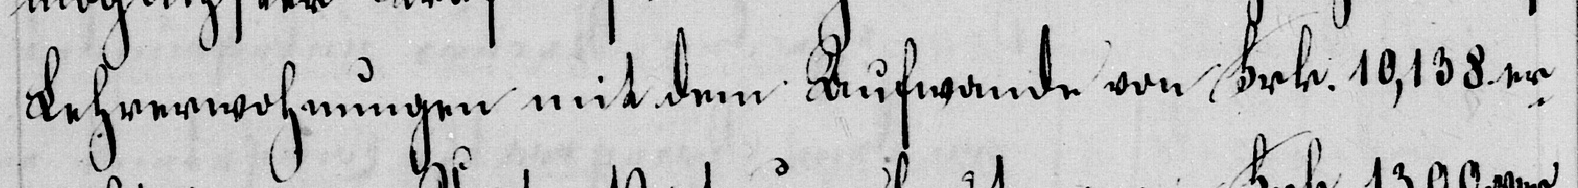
Lehrerwohnungen mit dem Aufwande von Frk. 10,138. er¬
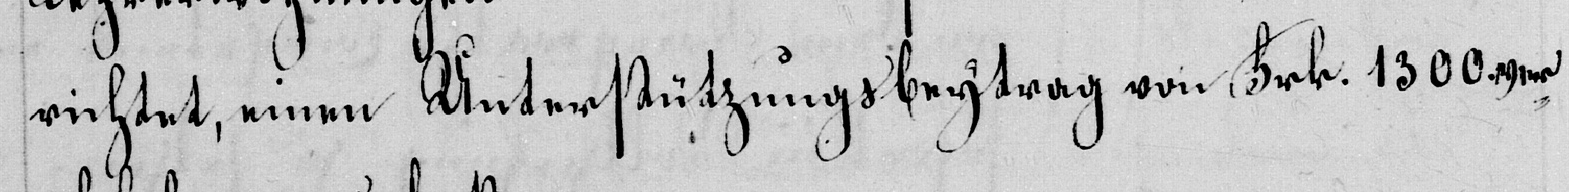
richtet, einen Unterstützungsbeytrag von Frk. 1300. ver¬
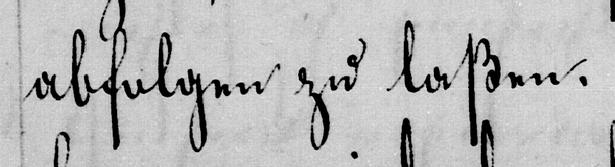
abfolgen zu laßen.
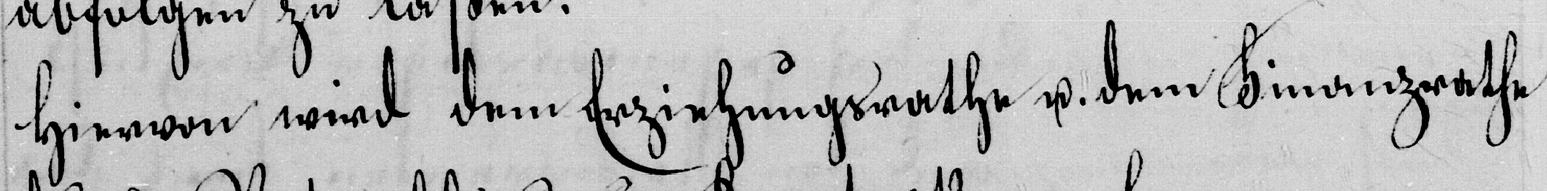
Hiervon wird dem Erziehungsrathe u. dem Finanzrathe
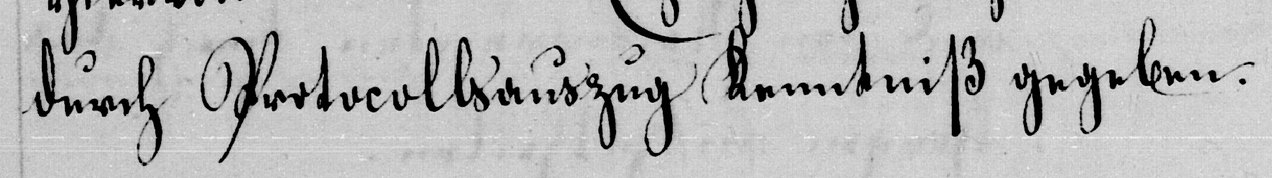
durch Protokollsauszug Kenntniß gegeben.
